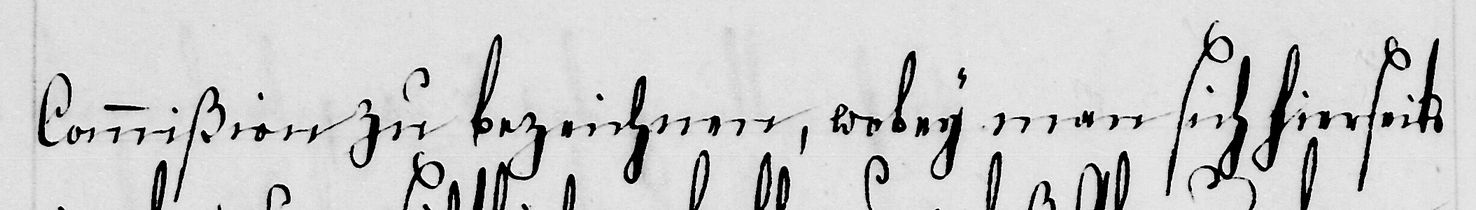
Commißion zu bezeichnen, wobey man sich hierseits
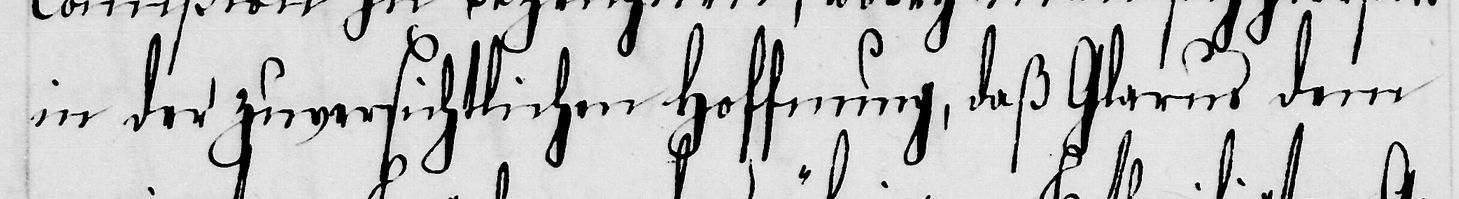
in der zuversichtlichen Hoffnung, daß Glarus dem
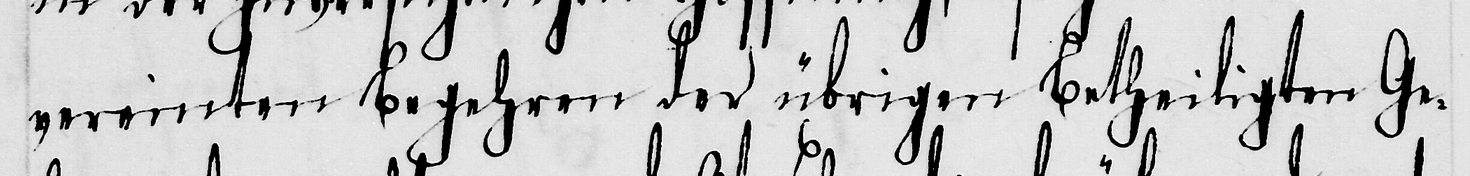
vereinten Begehren der übrigen Betheiligten Ge¬
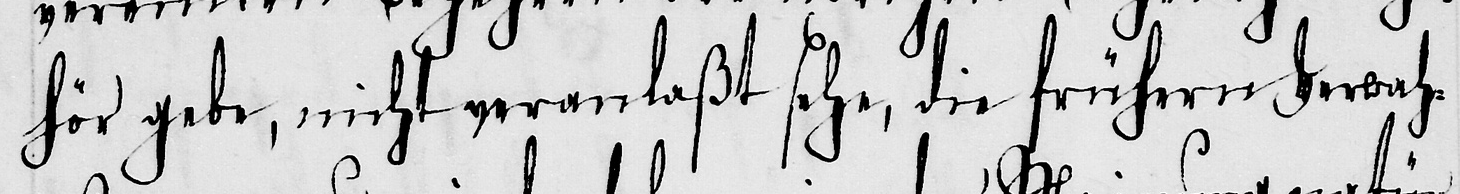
hör gebe, nicht veranlaßt sehe, die frühern Verwah¬
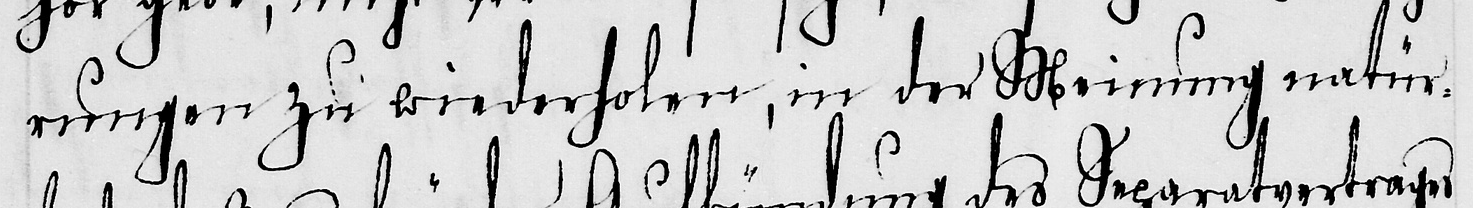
rungen zu wiederholen, in der Meinung natür¬
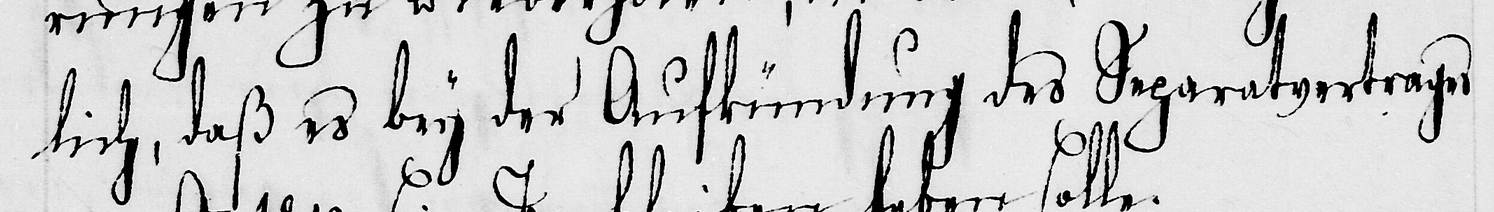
lich, daß es bey der Aufkündung des Separatvertrages
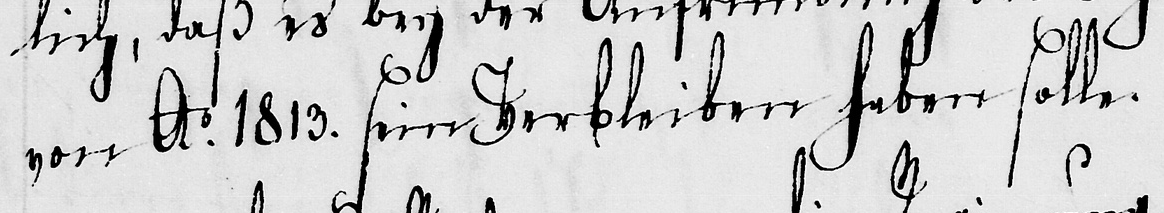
von A°. 1813. sein Verbleiben haben soll¬
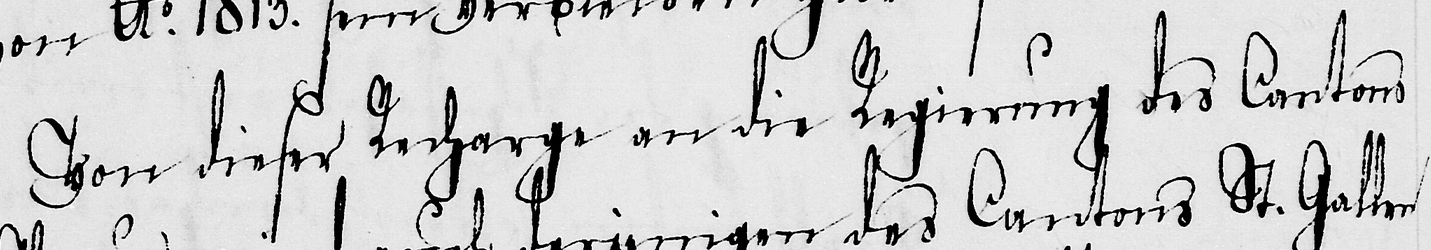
Von dieser Recharge an die Regierung des Cantons
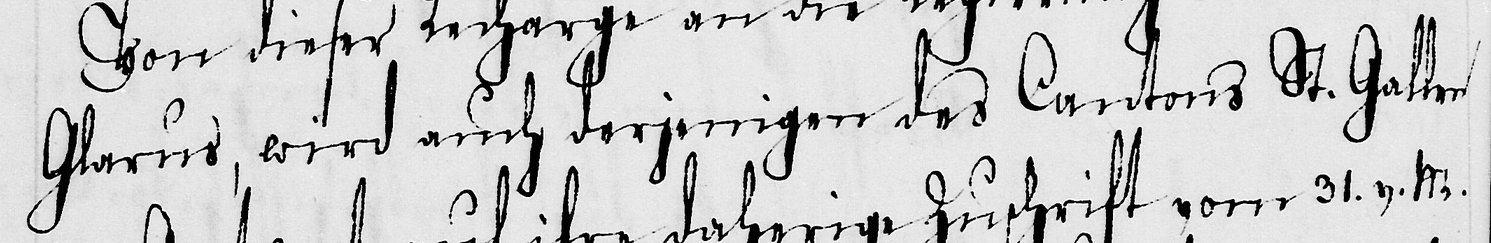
Glarus, wird auch derjenigen des Cantons St. Gallen
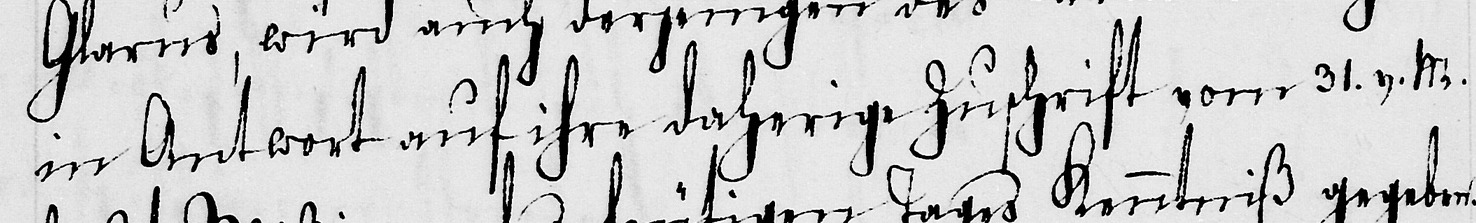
in Antwort auf ihre daherige Zuschrift vom 31. v.
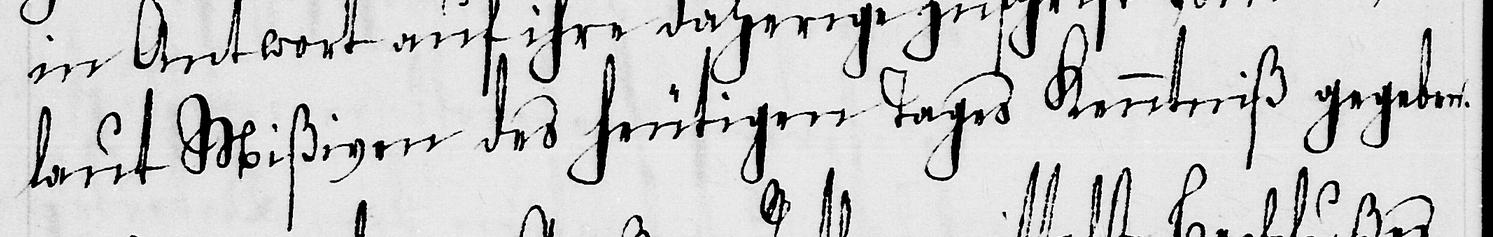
laut Mißiven des heutigen Tages Kenntniß gegeben.
